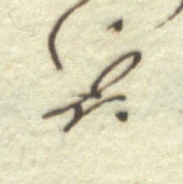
2.
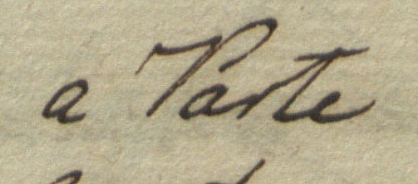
a Partte
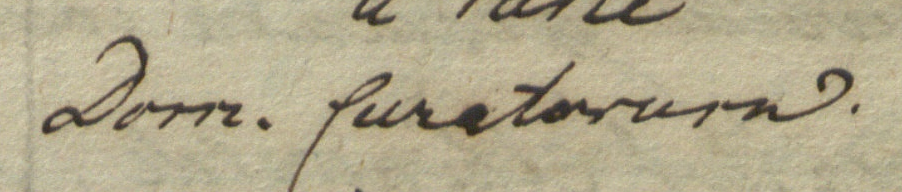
Dom. Curatorum
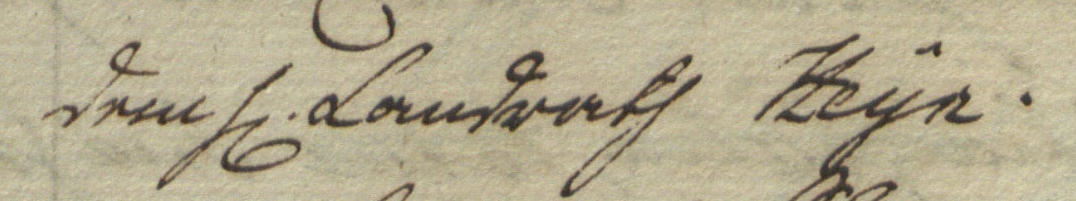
dem H. Landrath Heyn.
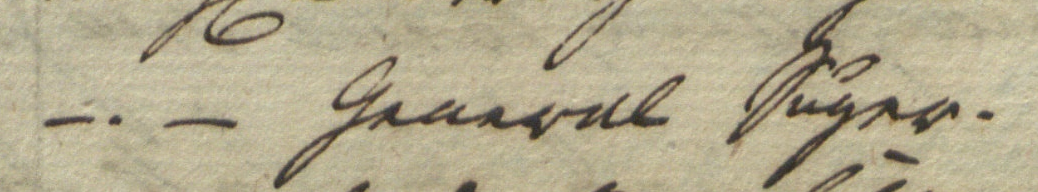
- " - General Super¬
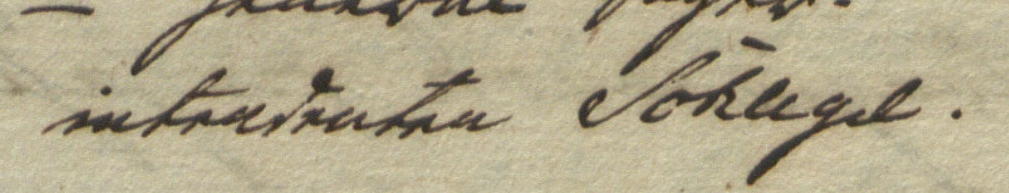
intendenten Schlegel
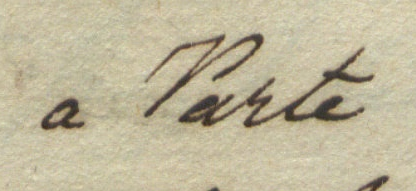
a Parte
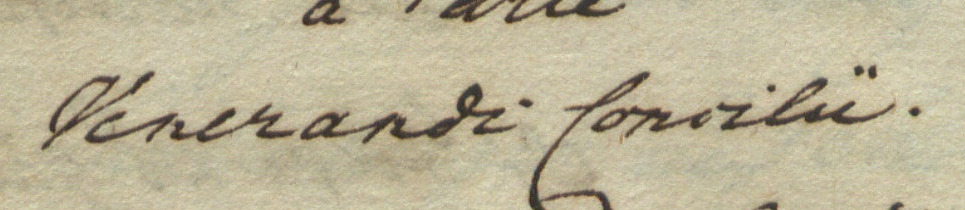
Venerandi Concilii.
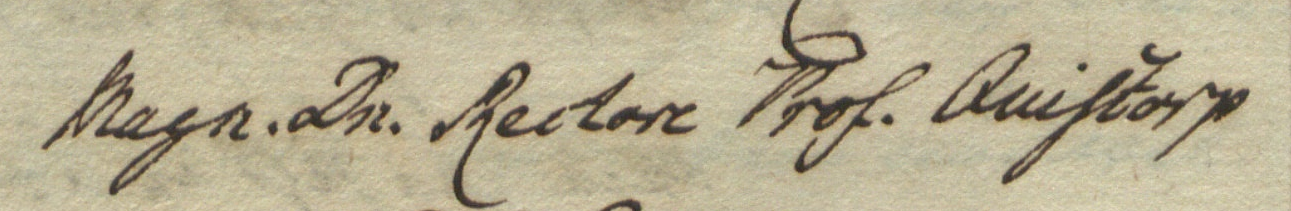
Magn. Dn. Rectore Prof. Quistorp
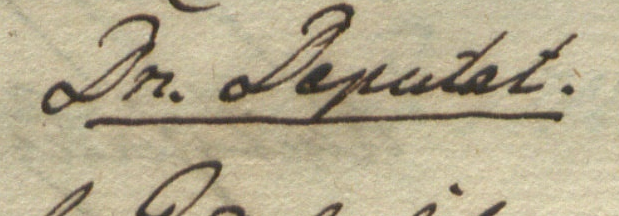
Dn. Deputat.
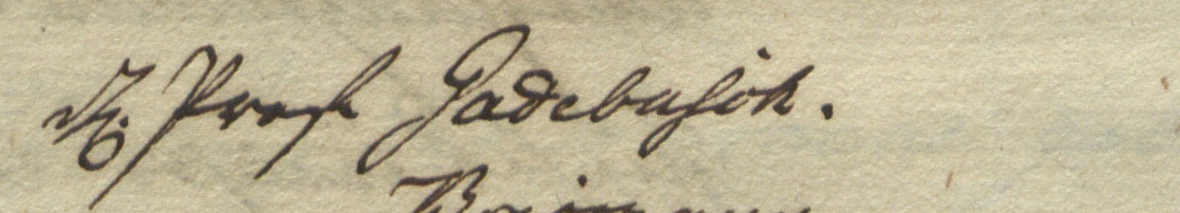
dh. Prof. Gadebusch.
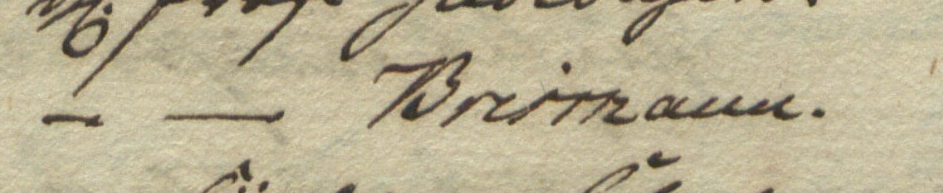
- - Brismann.
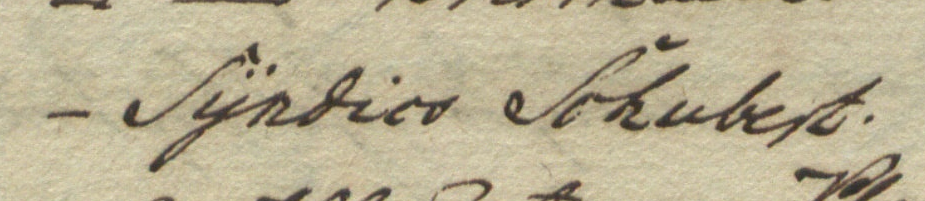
- Syndico Schubert.
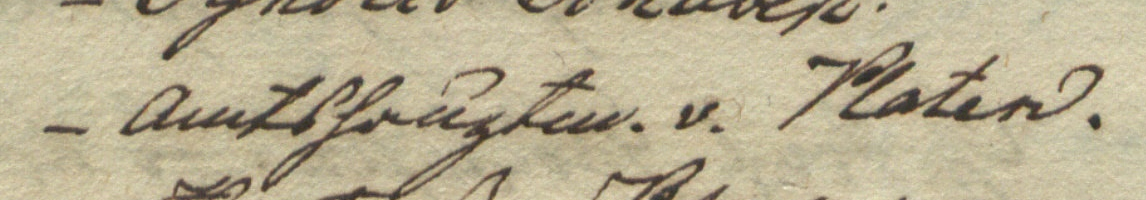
- Amtshauptm. v. Platen.
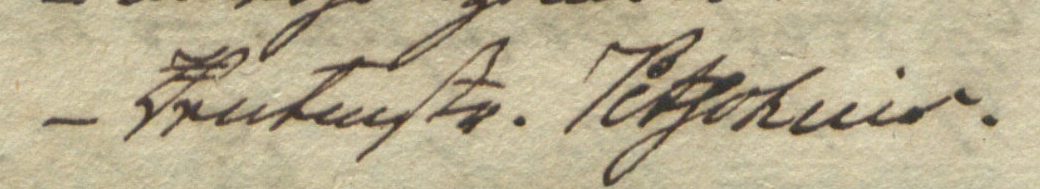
- Rentmstr. Petschius.
